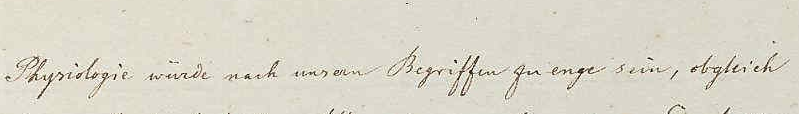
Physiologie würde nach unsern Begriffen zu enge sein, obgleich
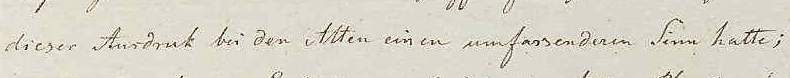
dieser Ausdruk bei den Alten einen umfassenderen Sinn hatte;
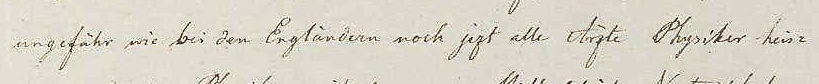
ungefähr wie bei den Engländern noch jezt alle Ärzte Physiker heis-
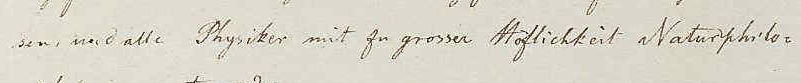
sen, und alle Physiker mit zu grosser Höflichkeit Naturphilo-
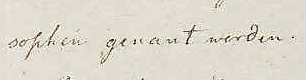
sophen genant werden.
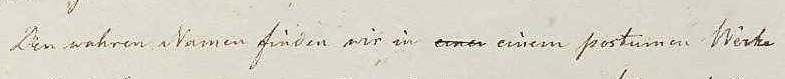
Den wahren Namen finden wir in einereinem postumen Werke
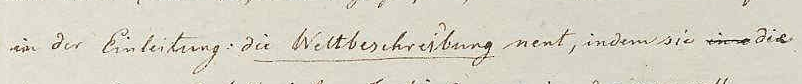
in der Einleitung: die Weltbeschreibung nent, indem sie in edie
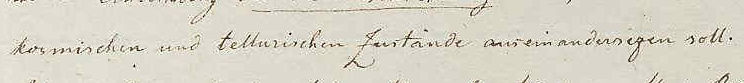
kosmischen und tellurischen Zustände auseinandersezen soll.
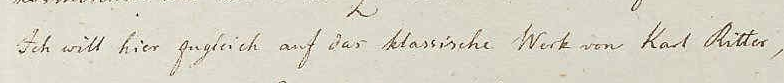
Ich will hier zugleich auf das klassische Werk von Karl Ritter,
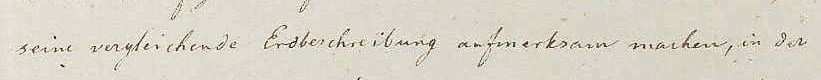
seine vergleichende Erdbeschreibung aufmerksam machen, in der
